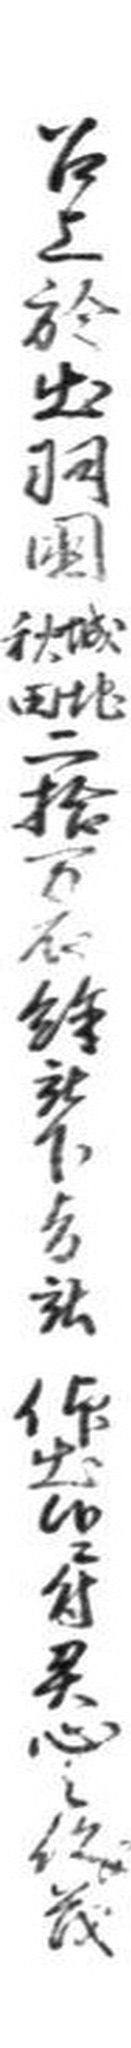召上於出羽国城地秋田ニ拾万石余被下旨被仰出候ニ付異心之儀茂
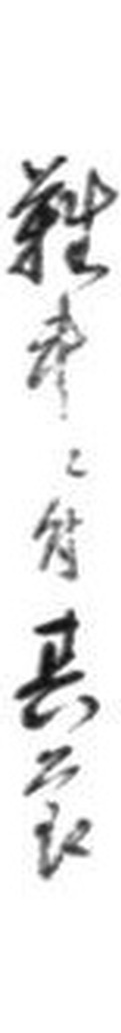難斗ニ付其節
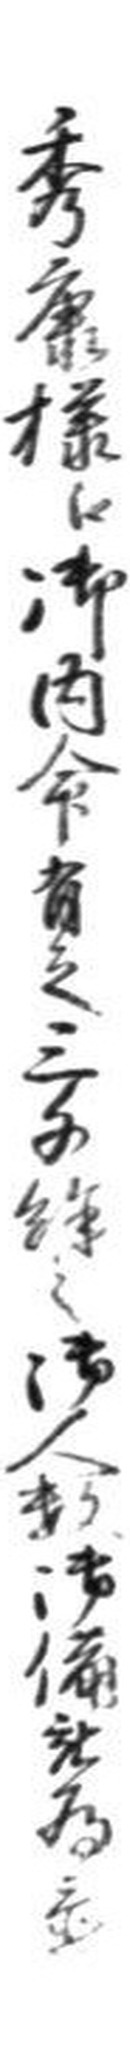秀康様江御内命有之三千余之御人数御備被為置
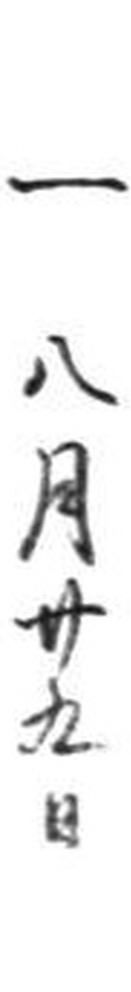一八月廿九日
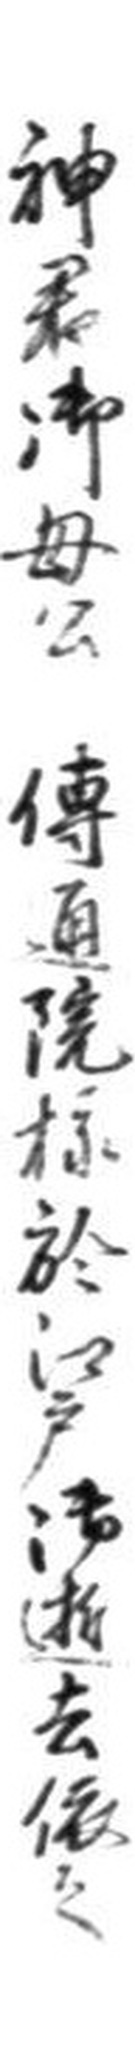神君御母公伝通院様於江戸御逝去依之
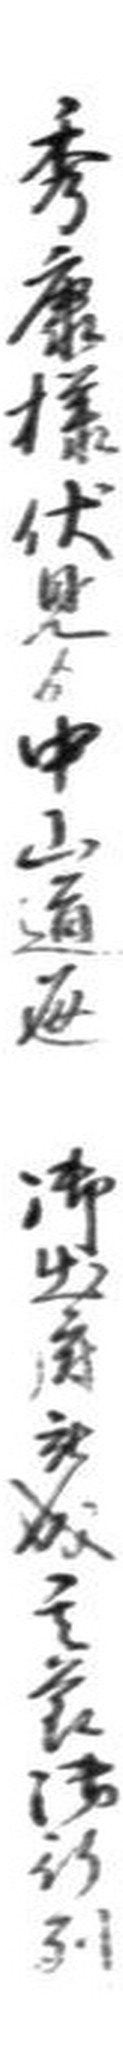秀康様伏見ゟ中山道通御出府被成其節御行列
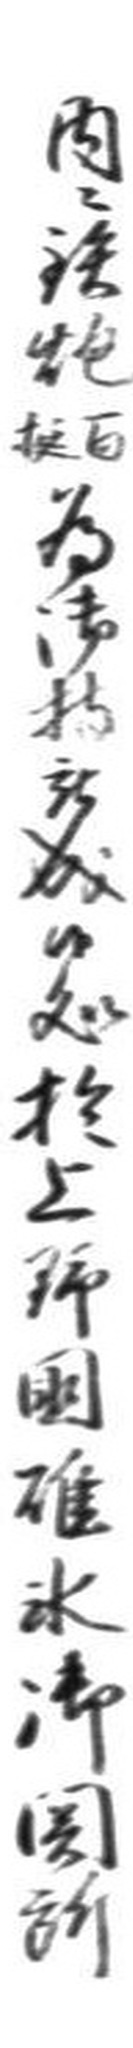内ニ鉄炮百挺為御持被成候処於上野国碓氷御関所
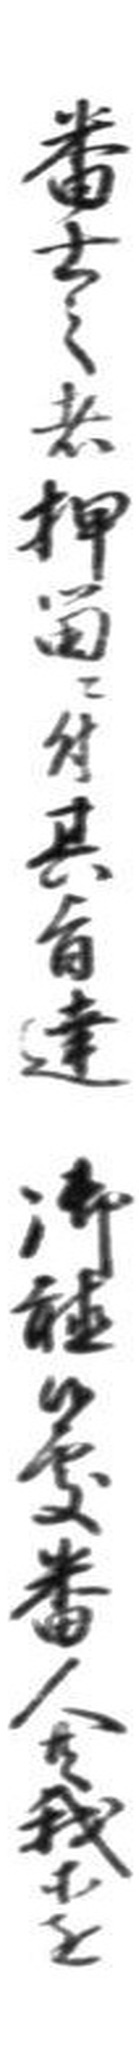番士之者押留ニ付其旨達御聴候処番人共我等を
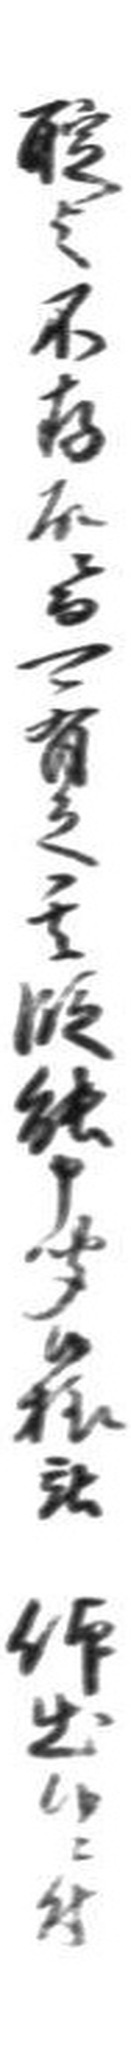聢与不存故ニ而可有之其段能申聞候様被仰出候ニ付
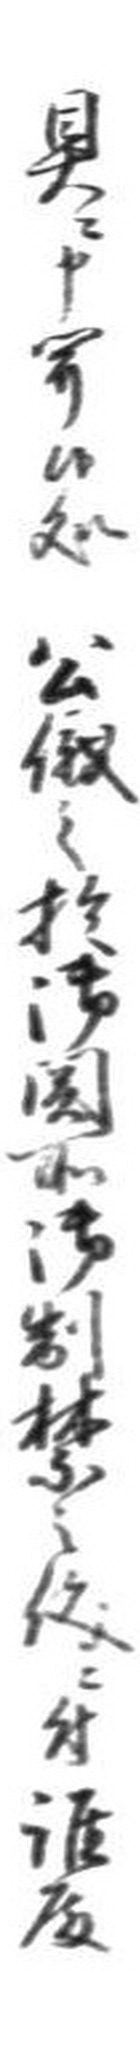具ニ申聞候処公儀之於御関所御制禁之儀ニ付誰殿
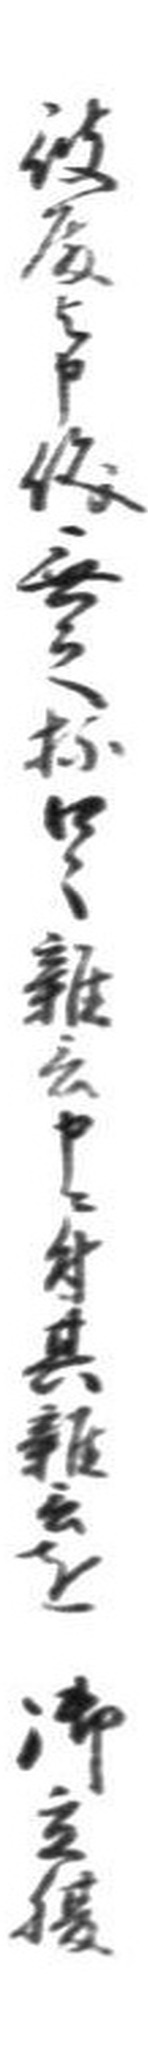彼殿与申儀無之抔口々難言申ニ付其難言を御立腹
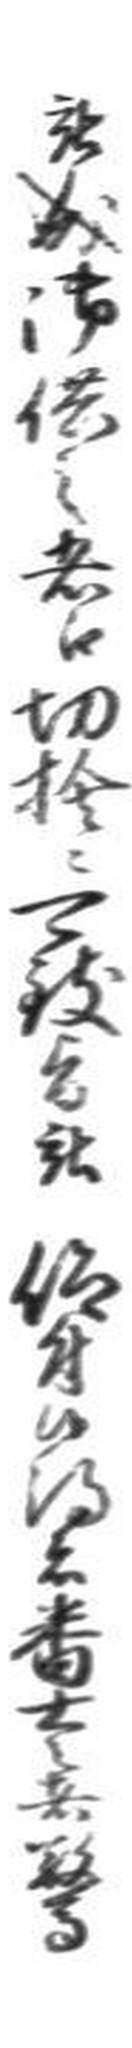被成御供之者江切捨ニ可致旨被仰付候得者番士之者驚
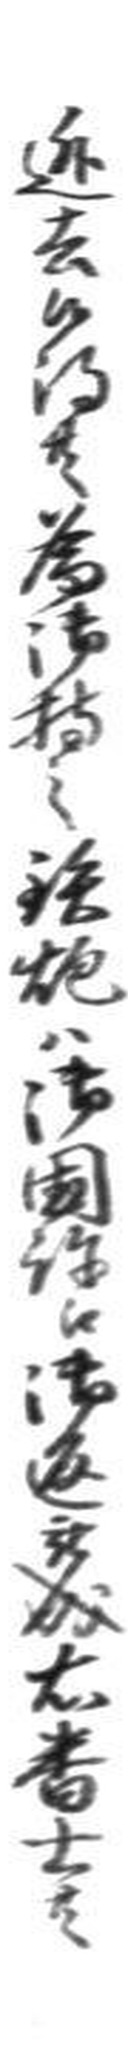逃去候得共為御持之鉄炮ハ御国許江御返被成右番士共
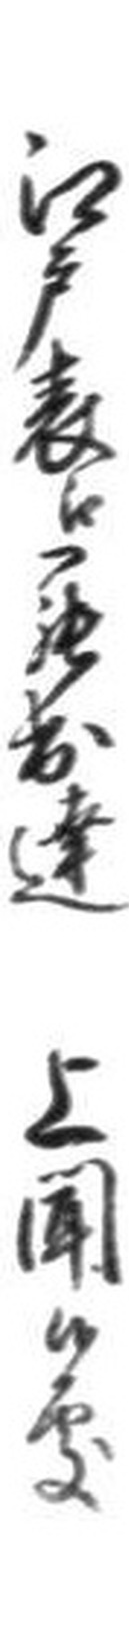江戸表江罷出達上聞候処
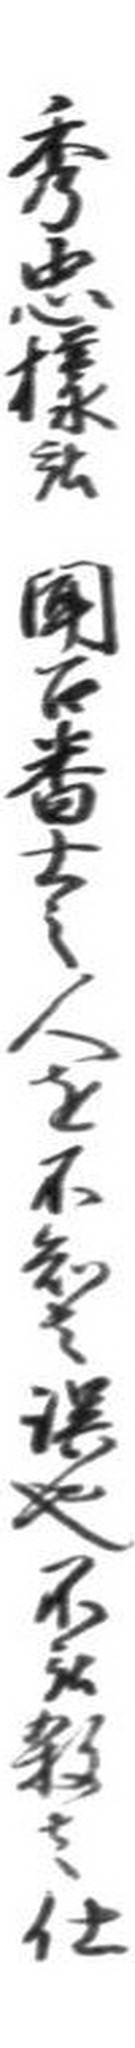秀忠様被聞召番士之人を不知者撰也不被殺者仕

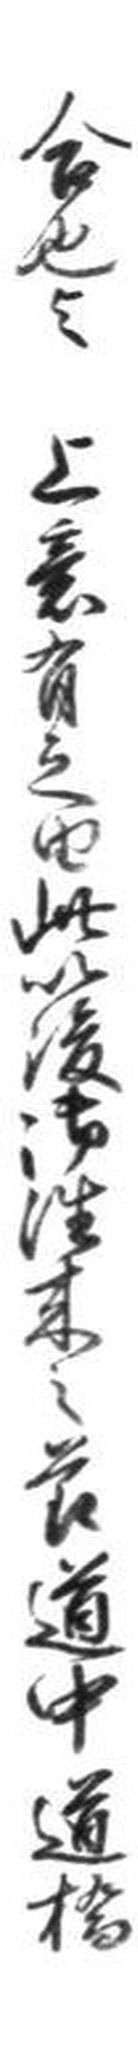合也与上意有之由此以後御往来之節道中道橋
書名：家譜 一 秀康公 従天正二年到慶長十二年
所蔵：福井県文書館 Fukui Prefectural Archives
